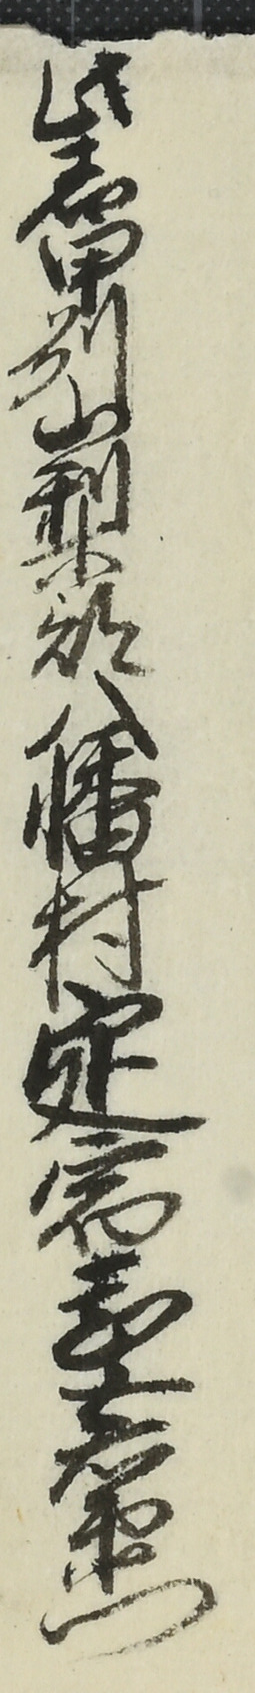此者甲州山梨郡八幡村定宿東明院

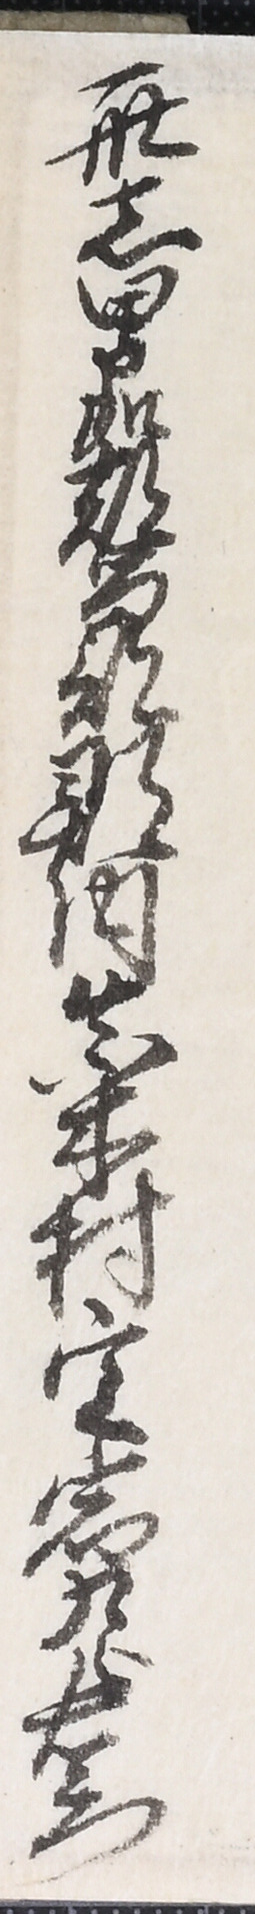此者此者甲州都留郡郡内真木村定宿九郎右衛門
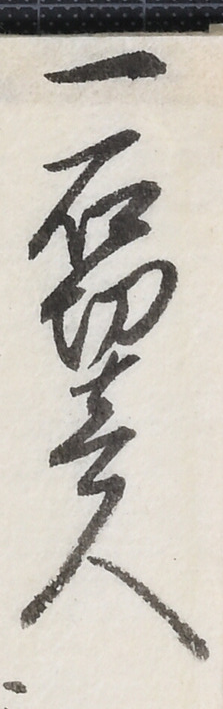一石切壱人
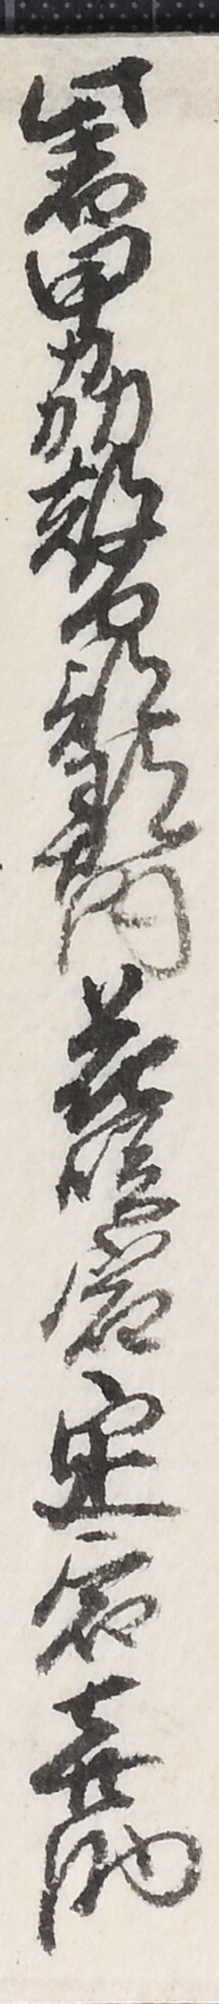此者此者甲州都留郡郡内花咲宿定宿喜助
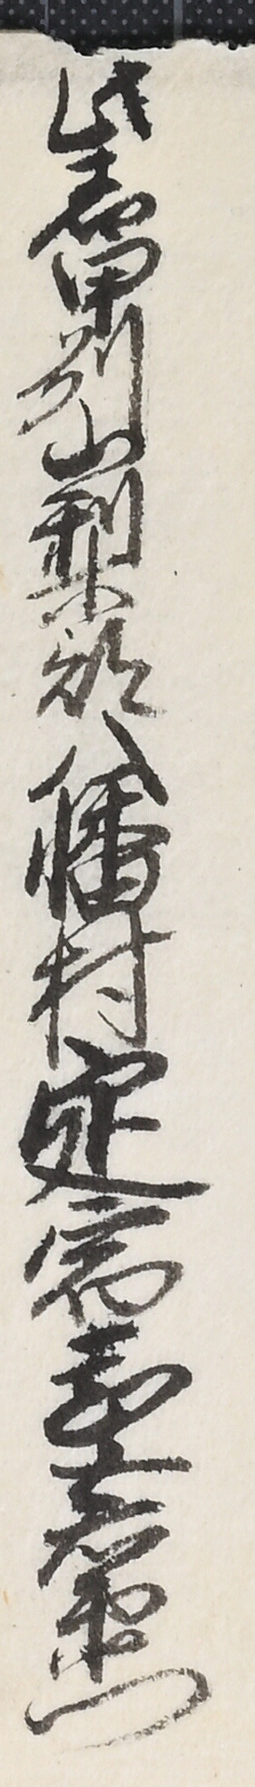此者甲州山梨郡八幡村定宿甚五右衛門
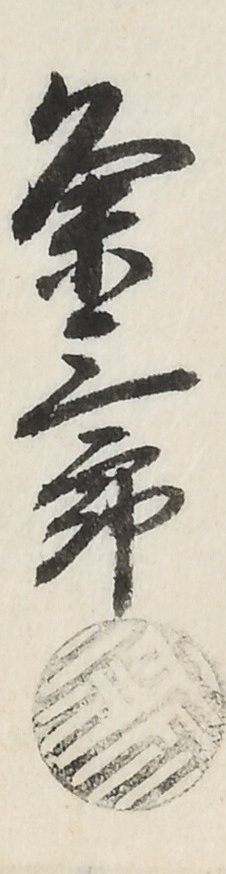粂三郎㊞
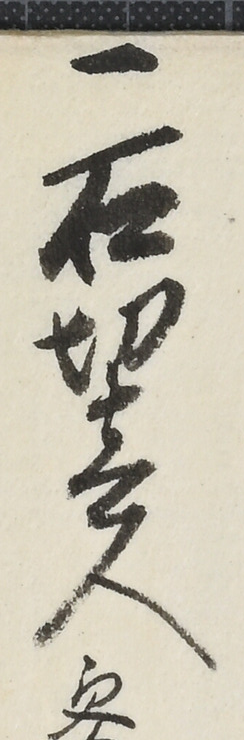一石切壱人
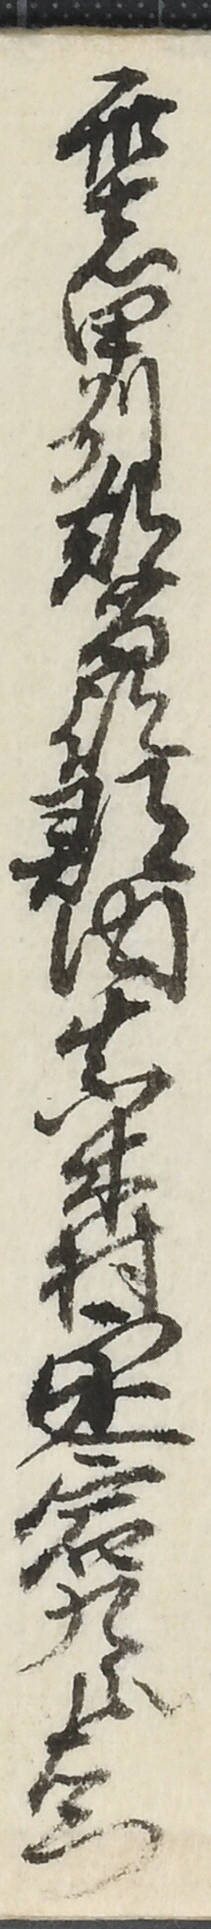此者此者甲州都留郡郡内真木村定宿九郎右衛門
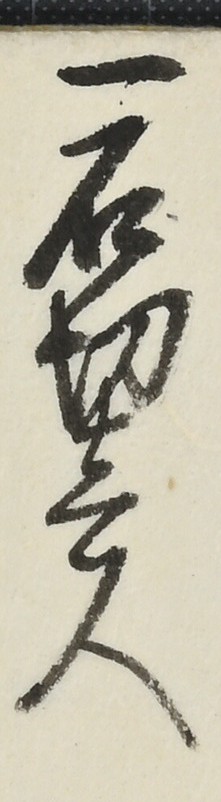一石切壱人
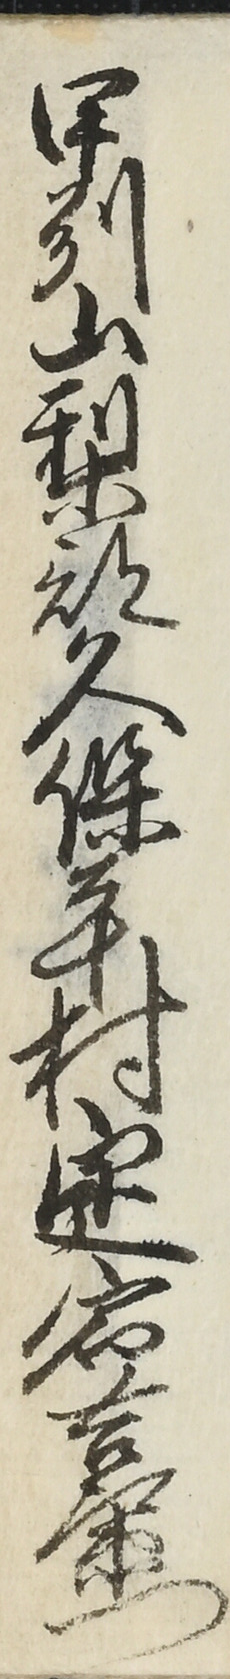甲州山梨郡久保平村定宿吉左衛門

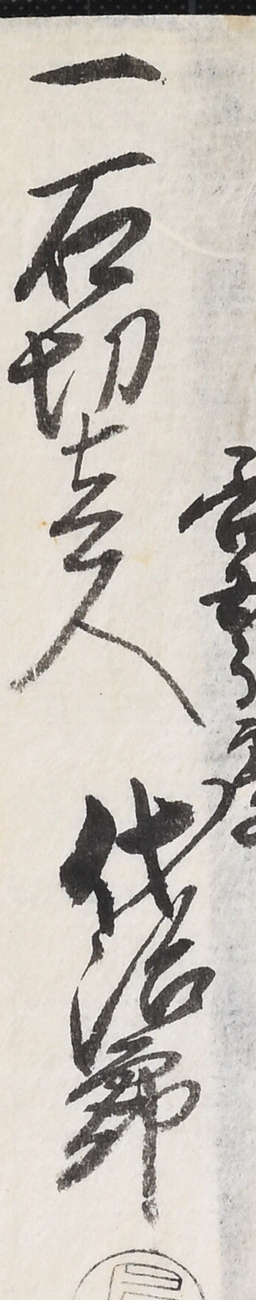一石切壱人代治郎㊞
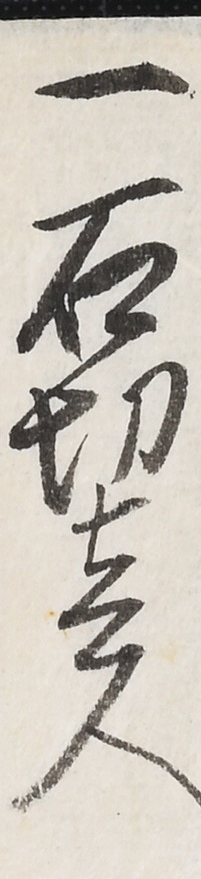一石切壱人
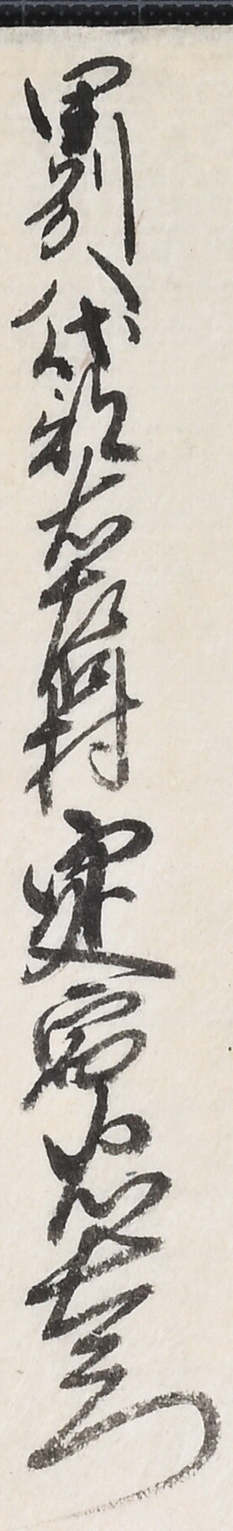甲州八代郡右左口村定宿忠右衛門
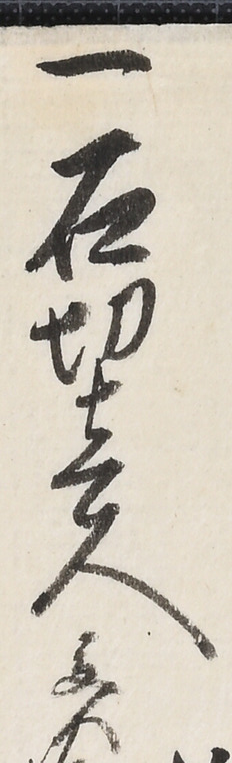一石切壱人
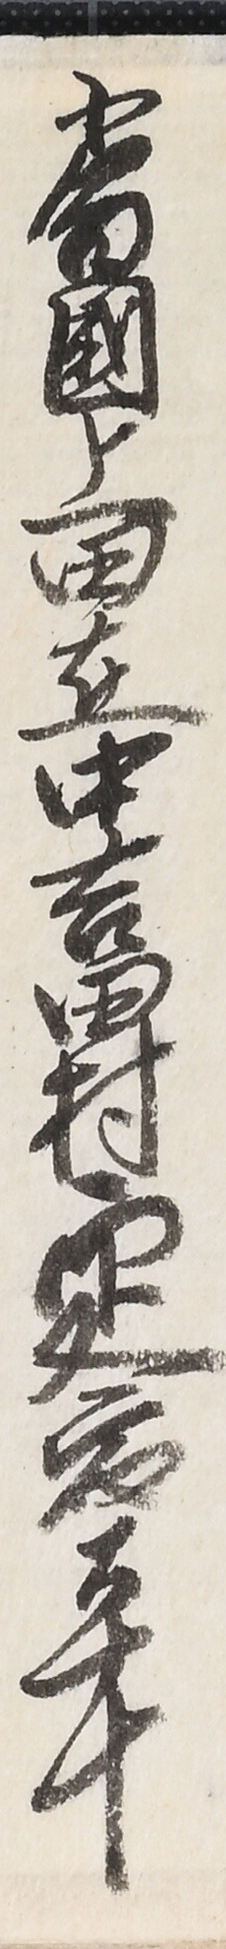当国上田在中吉田村定宿平十
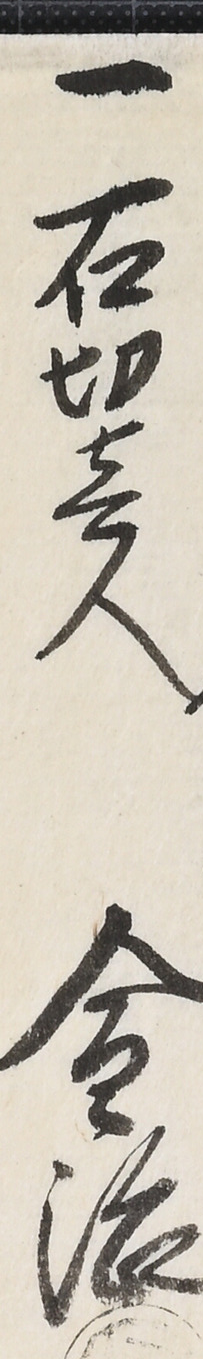一石切壱人金治㊞
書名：万延二辛酉年正月石切名前書上帳
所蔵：伊那市立高遠町図書館・合同会社AMANE
